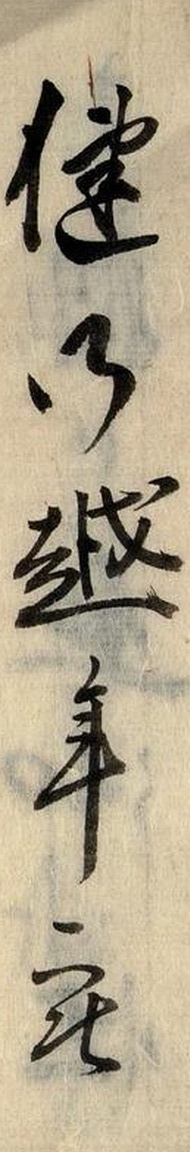健御越年被
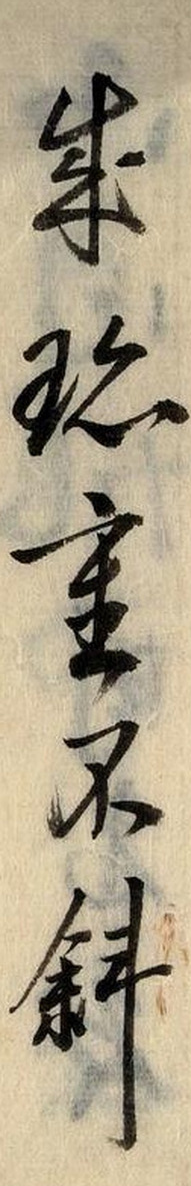成珍重不斜
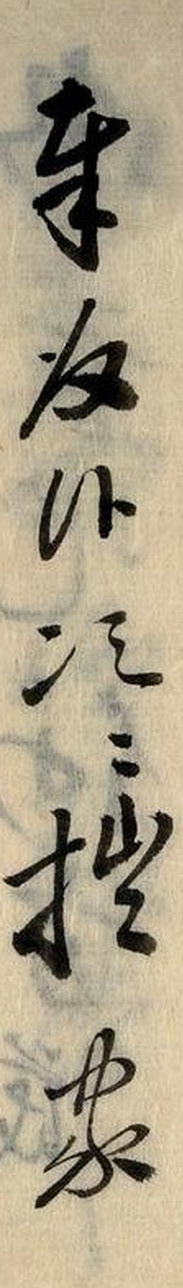奉存候次ニ拙家
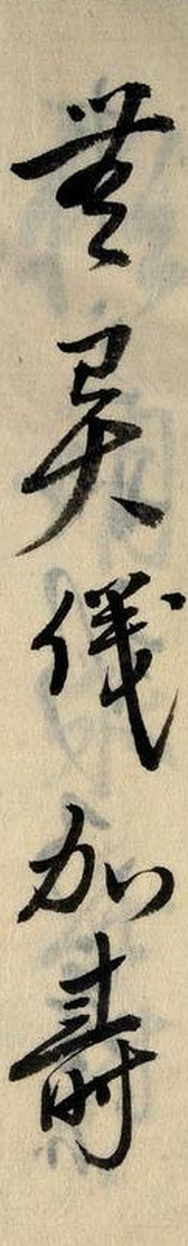無異儀加寿
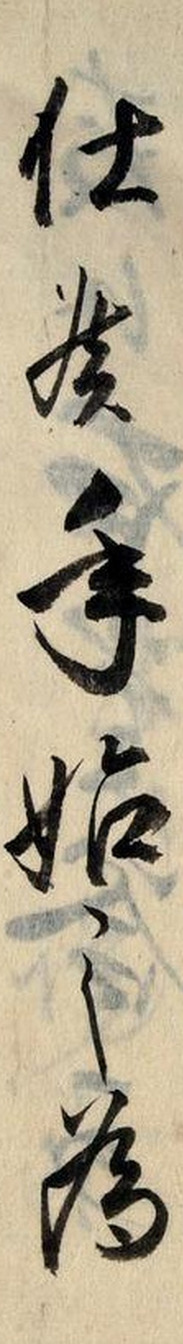仕候年始之為
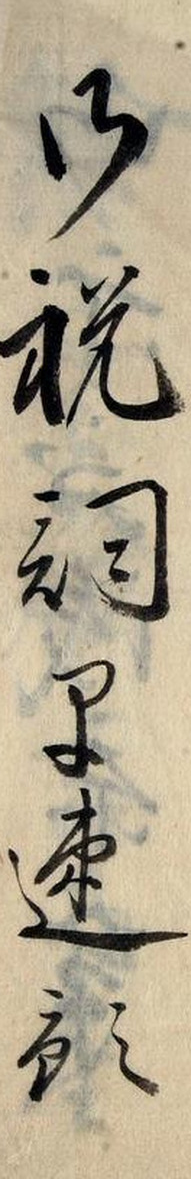御祝詞早速預

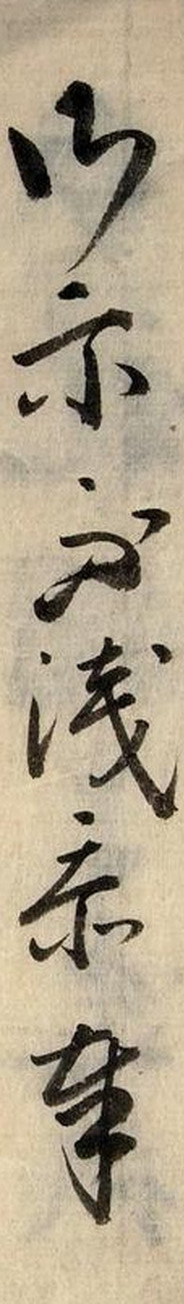御示不浅忝奉
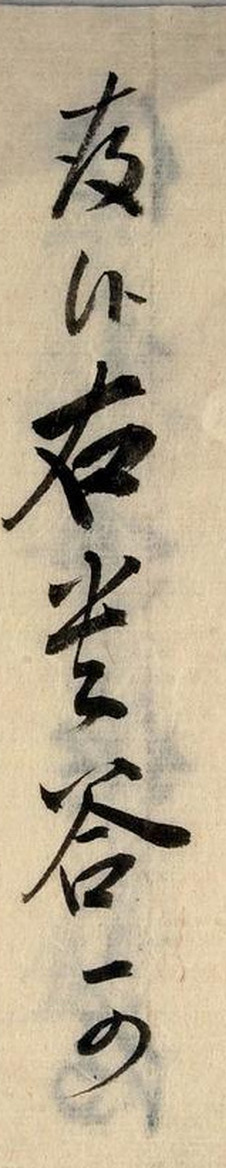存候右貴答可
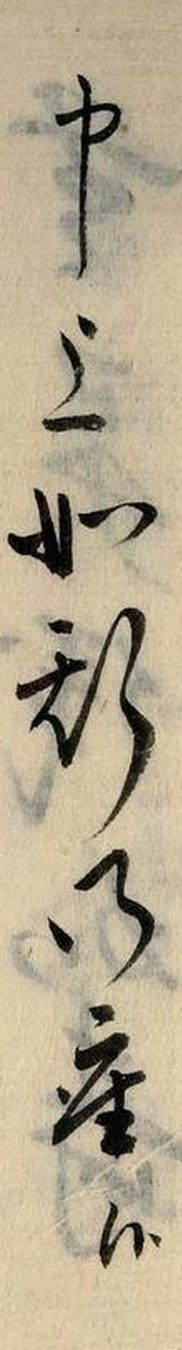申上如斯御座候
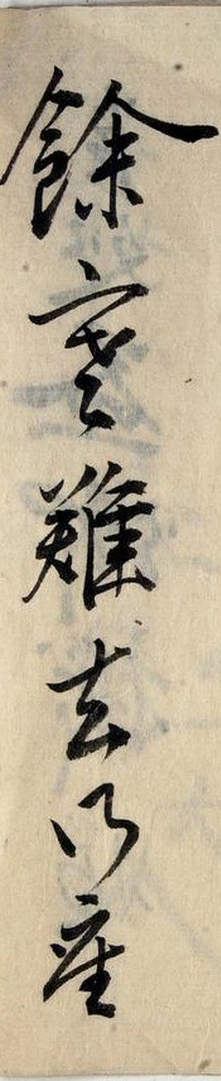余寒難去御座

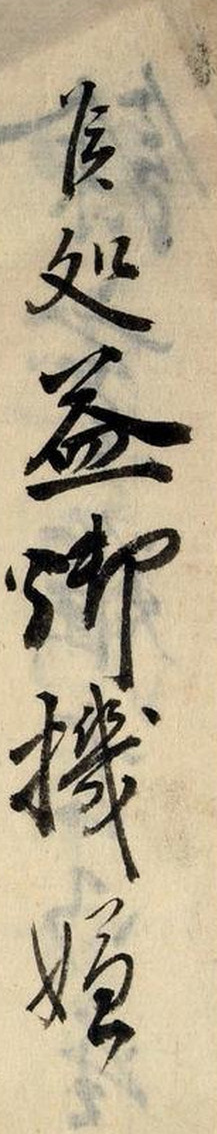候処益御機嫌
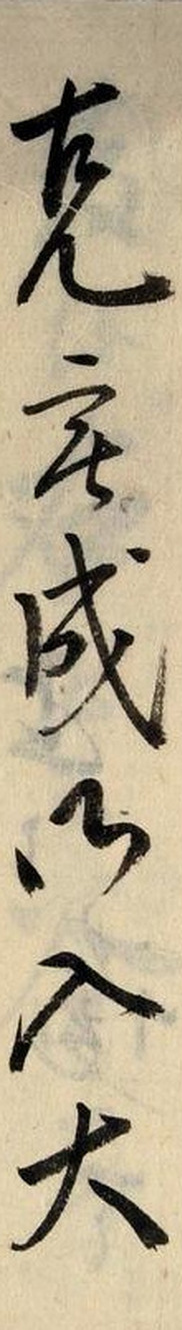克被成御入大
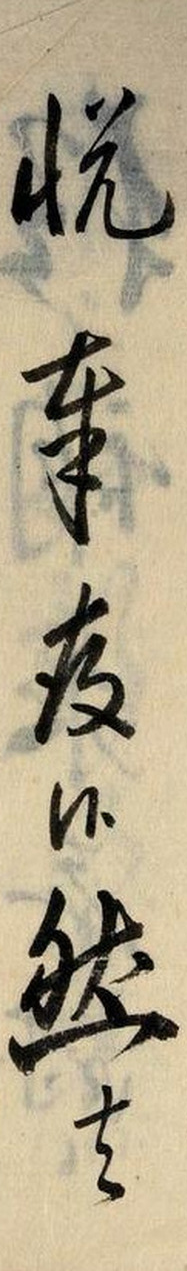悦奉存候然は
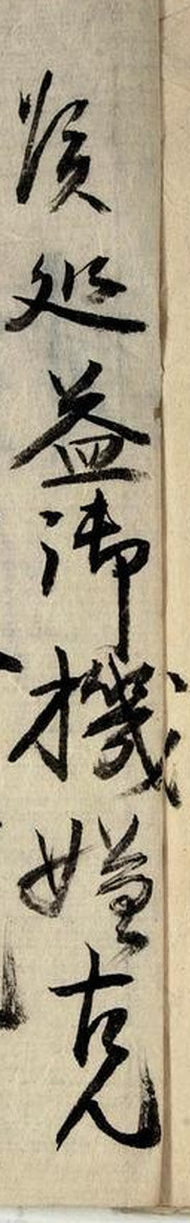候処益御機嫌克
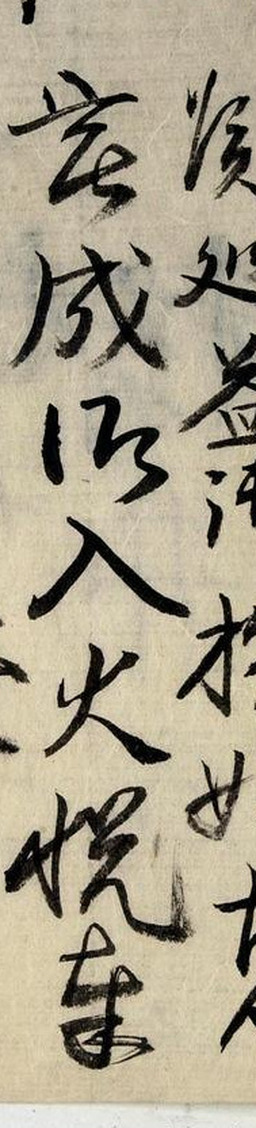被成御入大悦奉

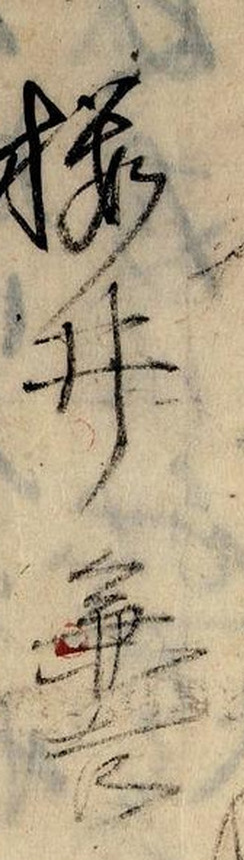桜井兼吉
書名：文章手本（手習）
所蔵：福井県文書館 Fukui Prefectural Archives
